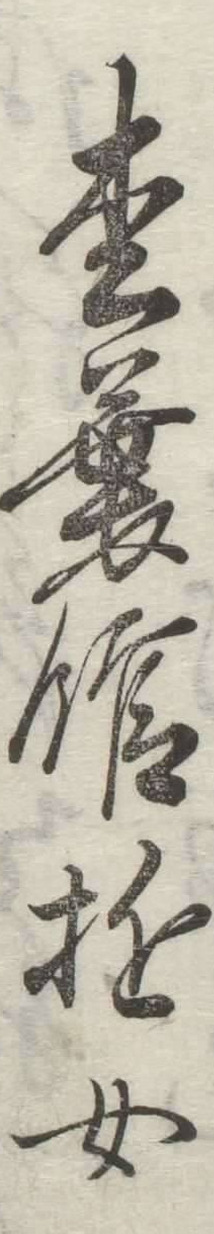松葉館遊女
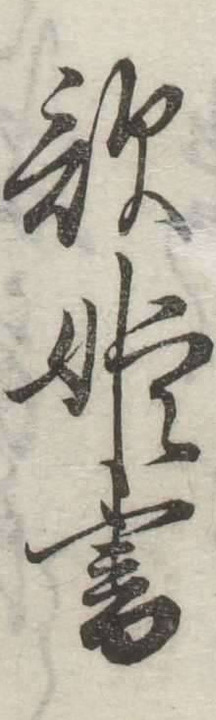歌姫書
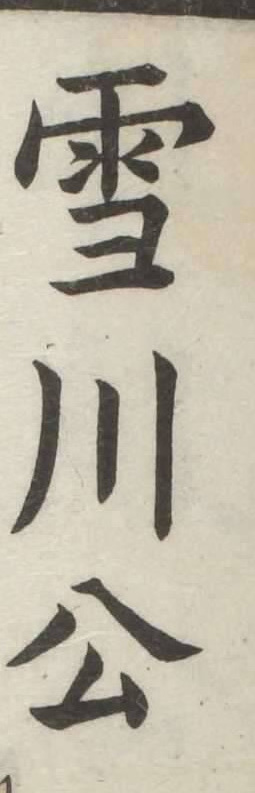雪川公
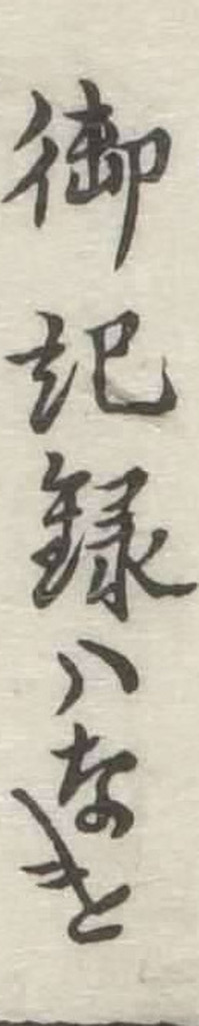御記録はなけ
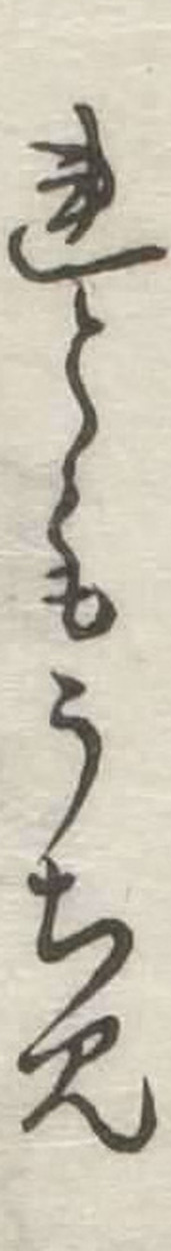れともうちみ
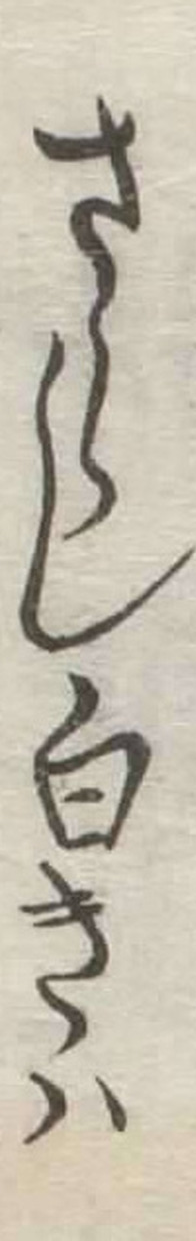さらし白きは
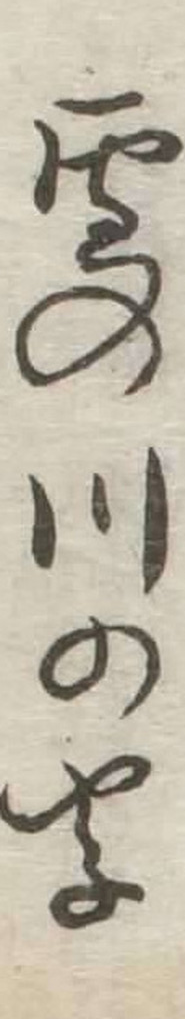雪の川の字
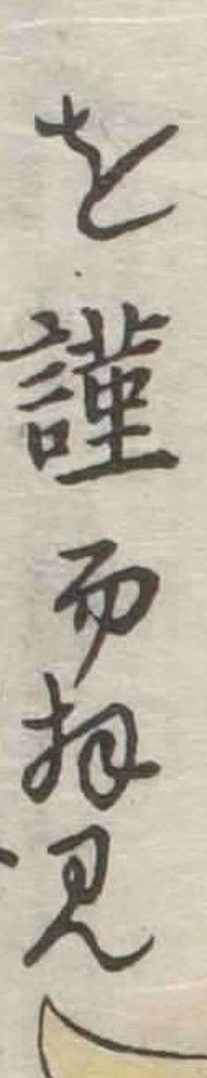を謹而拝見
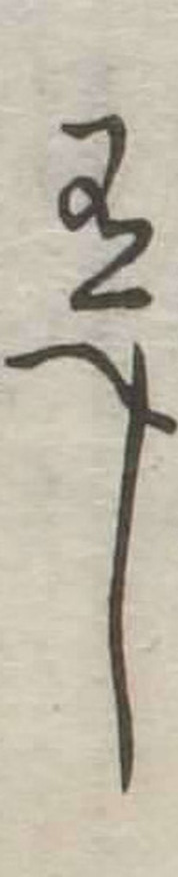有へし

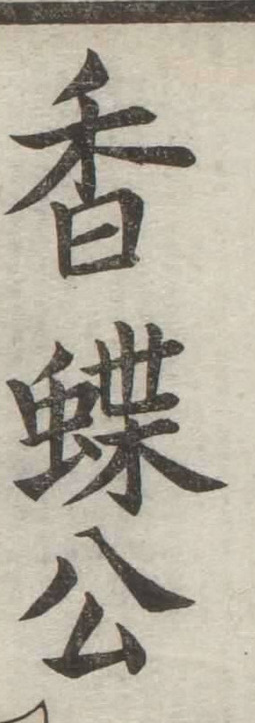香蝶公
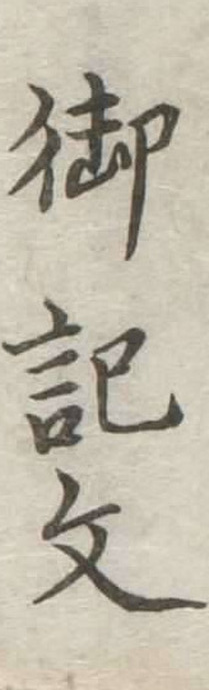御記文
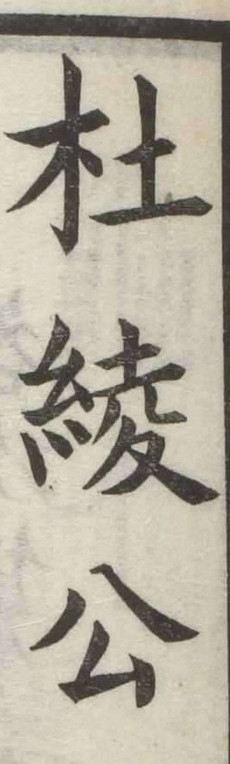杜綾公
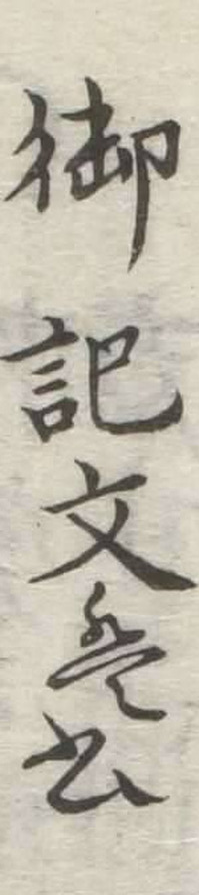御記文は書
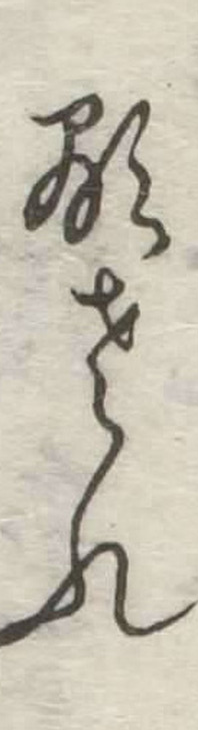顕され
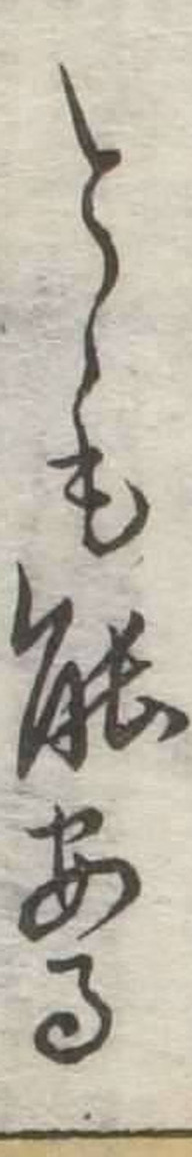とも能ある
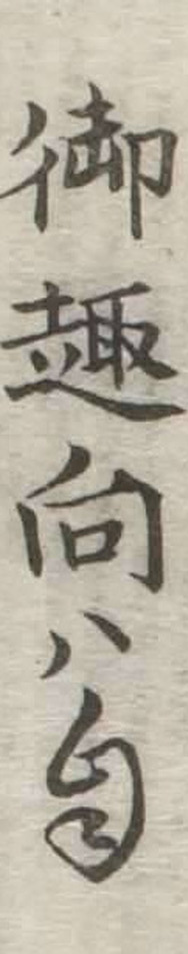御趣向は自
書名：たなくひあわせ
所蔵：国文学研究資料館
